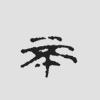不
